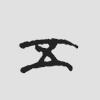五
